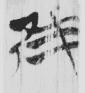隹
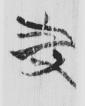寺
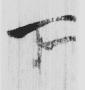下
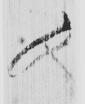民
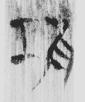{工隹}
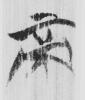帝
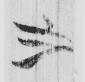之
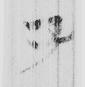子
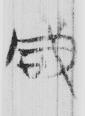咸
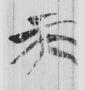天
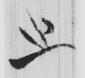之
